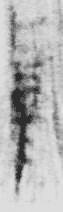○（詞）
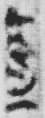宜
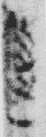道
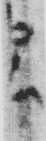也
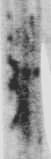○（笑）
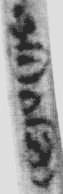憙（喜）
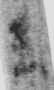之
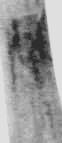○（淺）
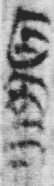睪（澤）
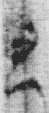也
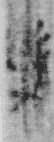樂
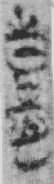憙（喜）
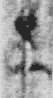之
